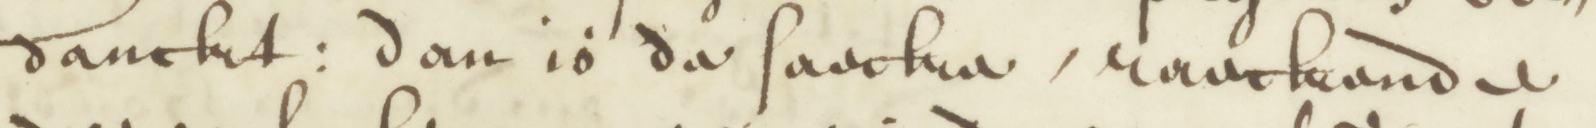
danckt: dan is de saecke, raeckende
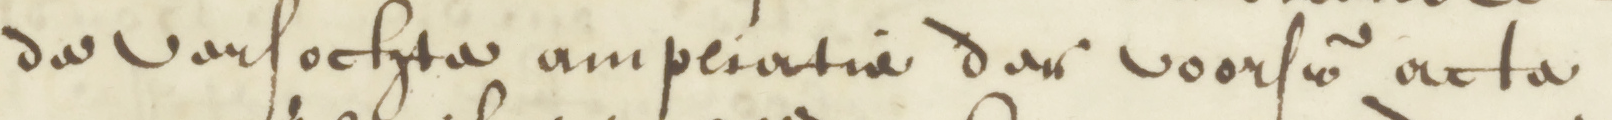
de versochte ampliatie der voorsr acte
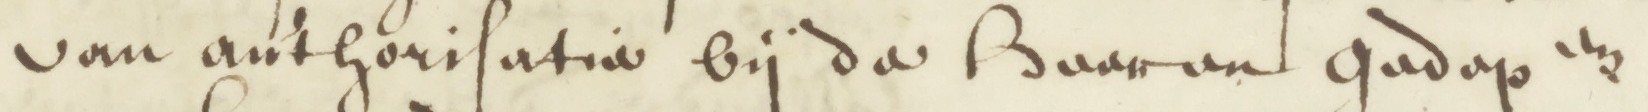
van authorisatie bij de Heeren Gedepen
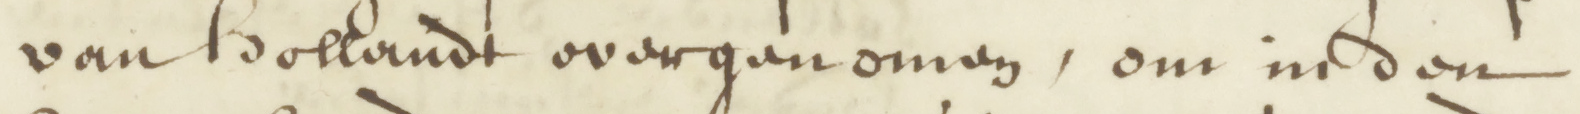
van Hollandt overgenomen, om in den
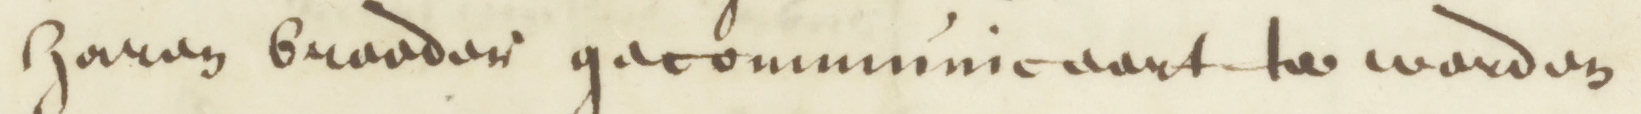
haren breeder gecommuniceert te werden
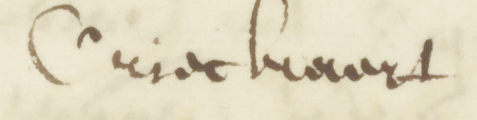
Crieckaert
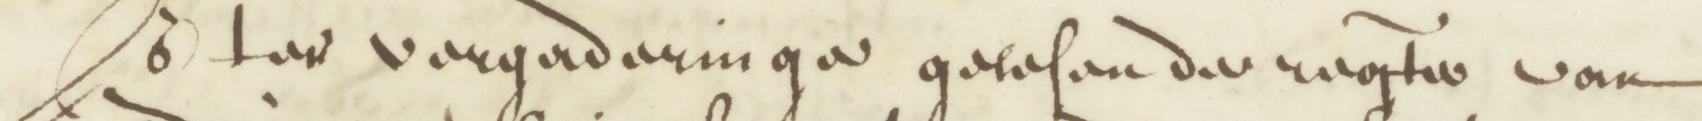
Is ter vergaderinge gelesen de reqte van
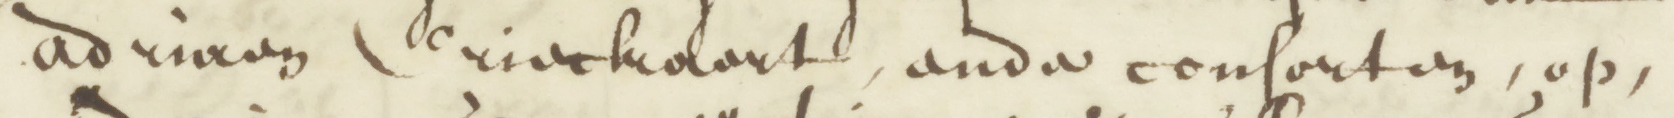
Adriaen Crieckaart, ende consorten, op,
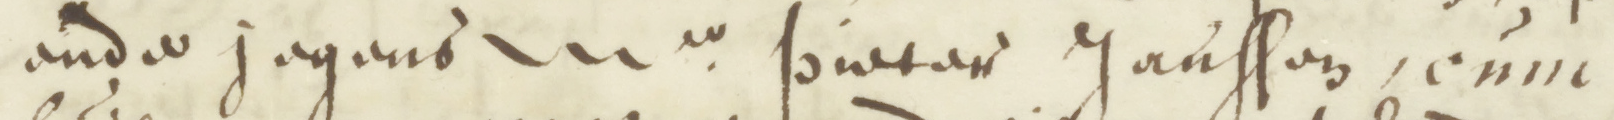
ende jegens mr. Pieter Jaussen, cum,
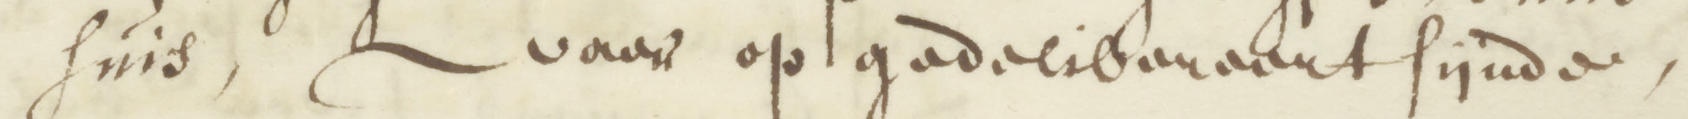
suis. Waer op gedelibereert sijnde,
